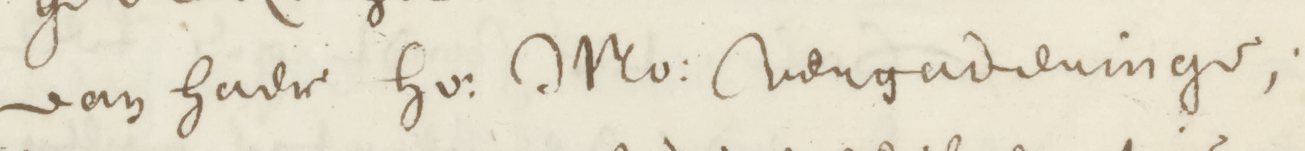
van haer ho:Mo: vergaderinge;
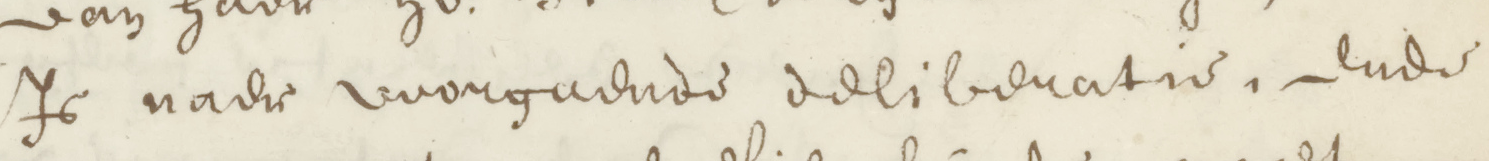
Is naer voorgaende deliberatie, ende
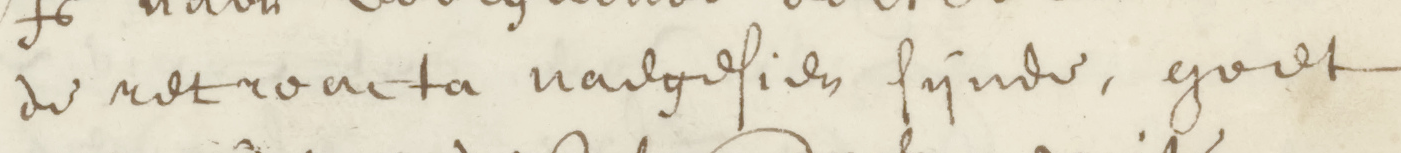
de retroacta naegesien sijnde, goet
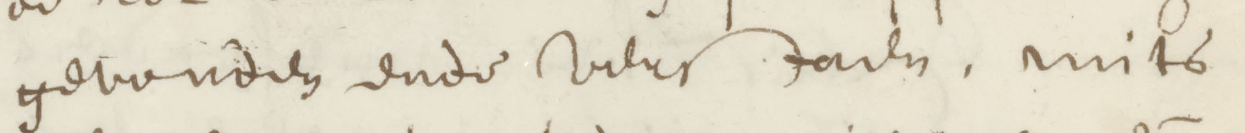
gevonden ende verstaen, mits
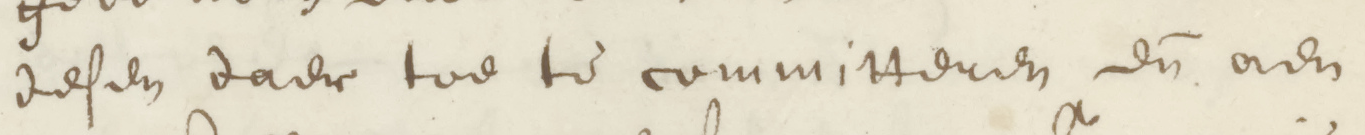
desen daer toe te committeren en aen
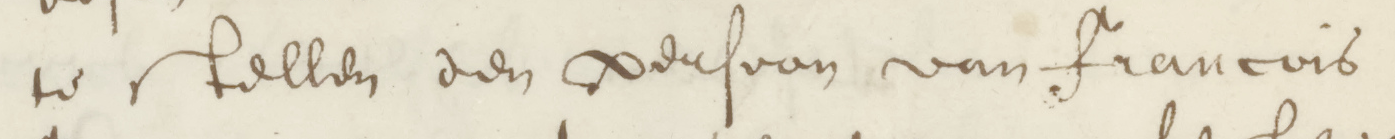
te stellen den persoon van Francois
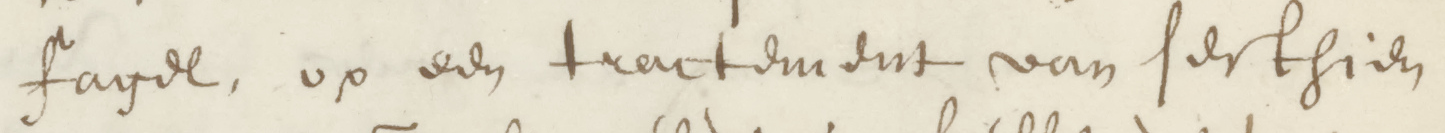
Fagel, op een tractement van sesthien
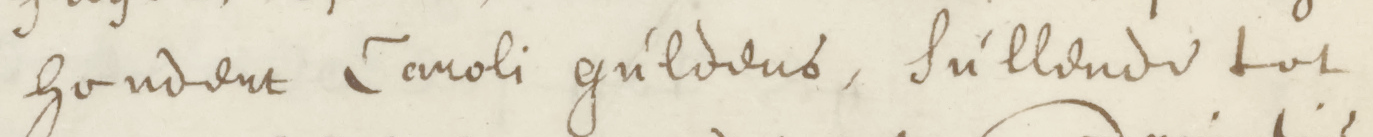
hondert Caroli guldens, sullende tot
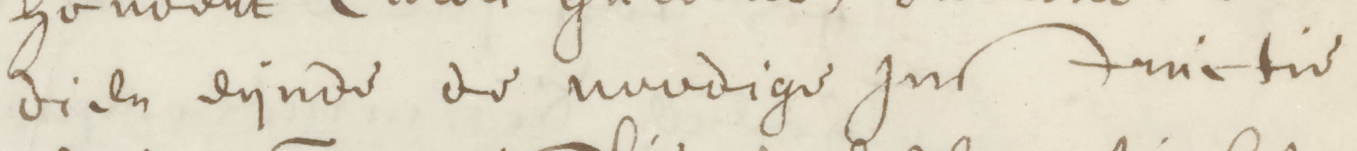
dien eijnde de noodige instructie
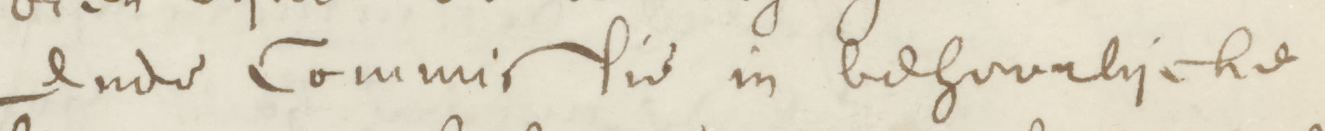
ende Commissie in behoorlijcke
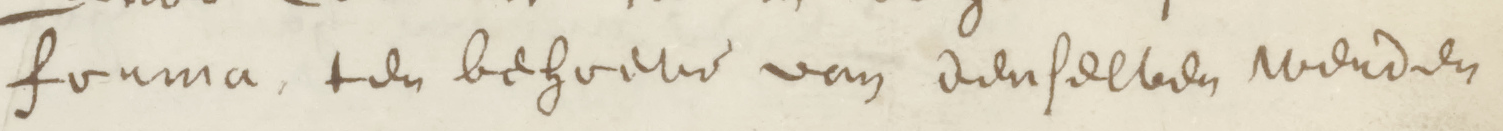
forma, ten behoeve van denselven werden
